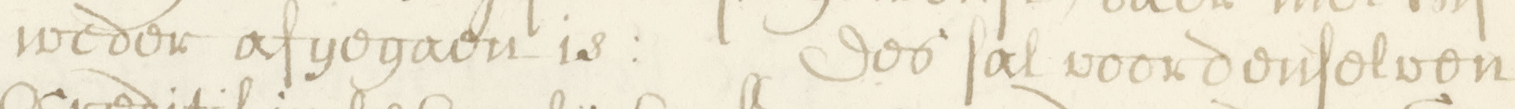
weder afgegaen is: Des sal voor denselven
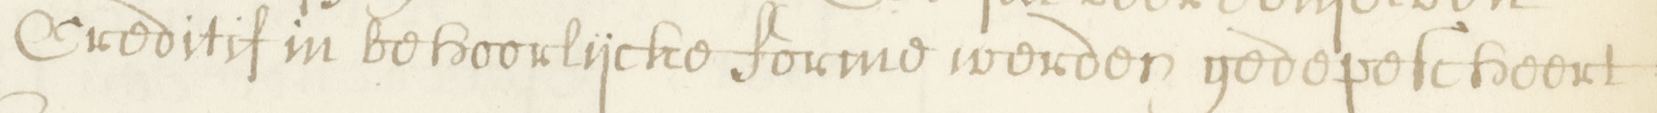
Creditif in behoorlijcke forme werden gedepescheert.
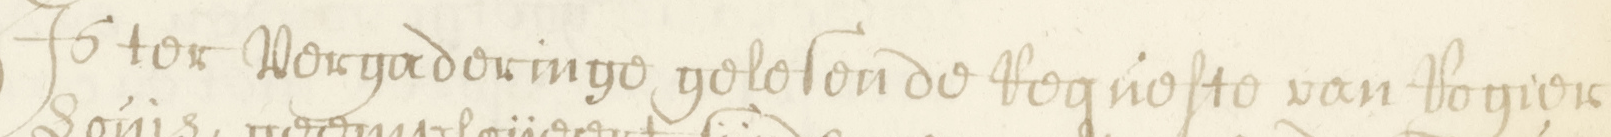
Is ter Vergaderinge gelesen de Requeste van Rogier
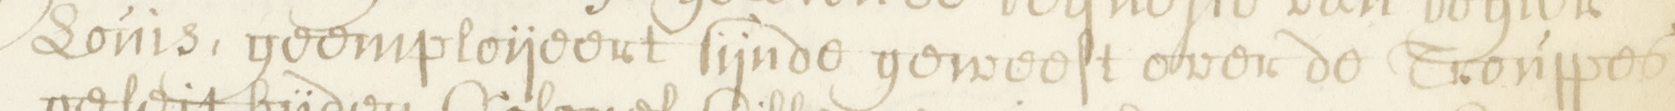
Louis, geemploijeert sijnde geweest over de Trouppes
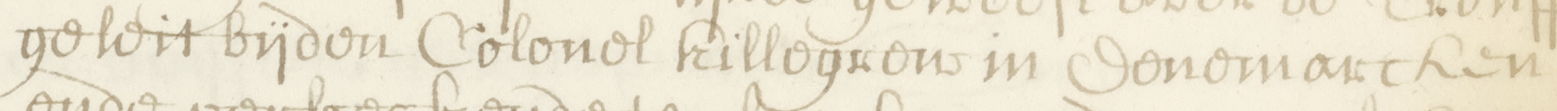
geleit bijden Colonel killegrens in Denemarcken
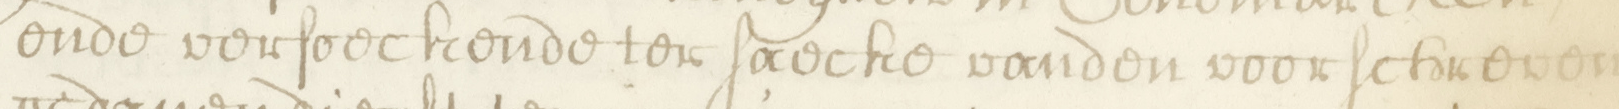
ende versoeckende ter saecke vanden voorschreven
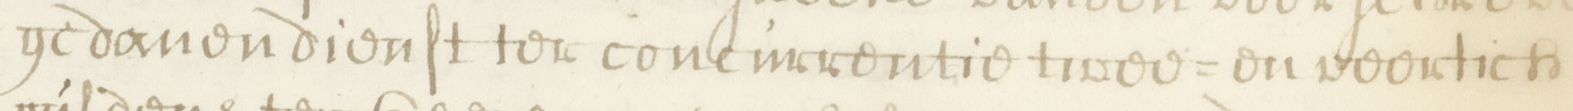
gedanen dienst ter concurrentie twee=en veertich
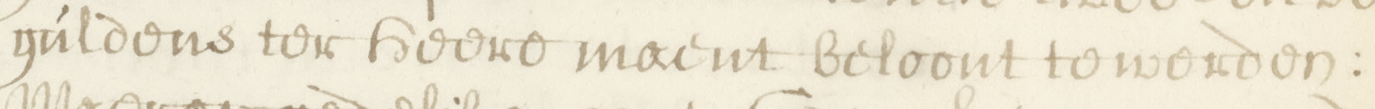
guldens ter heere maent beloont te werden:
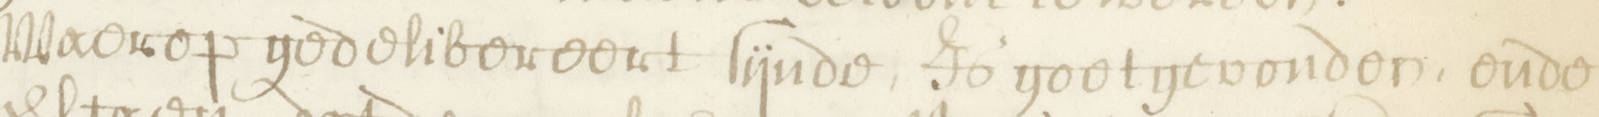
Waerop gedelibereert sijnde, Is goetgevonden, ende
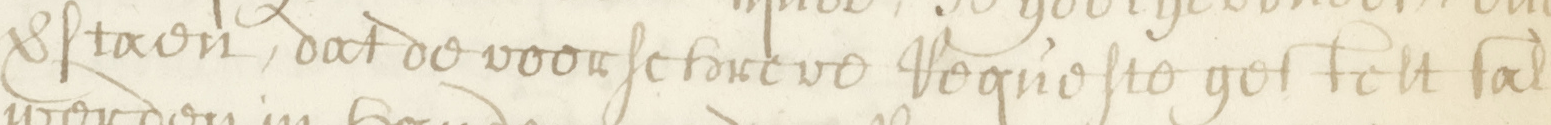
vstaen, dat de voorschreve Requeste gestelt sal
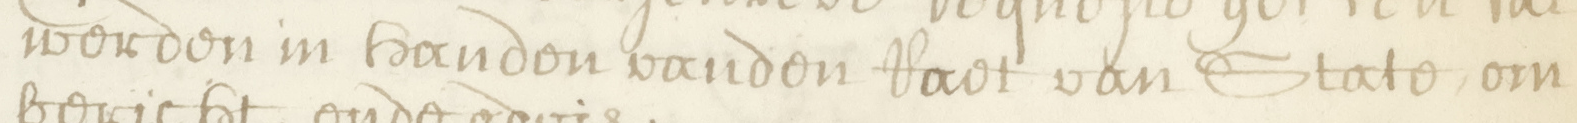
werden in handen vanden Raet van State, om
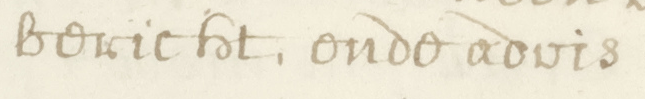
bericht, ende advis.
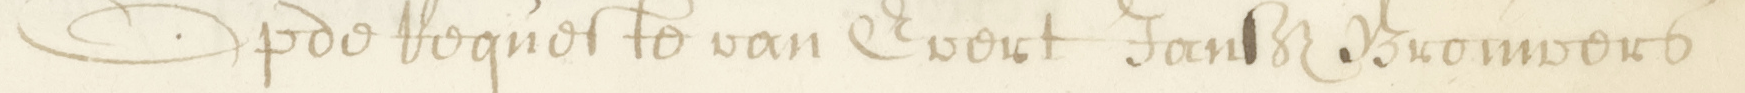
Opde Requeste van Evert Janssz Brouwers
